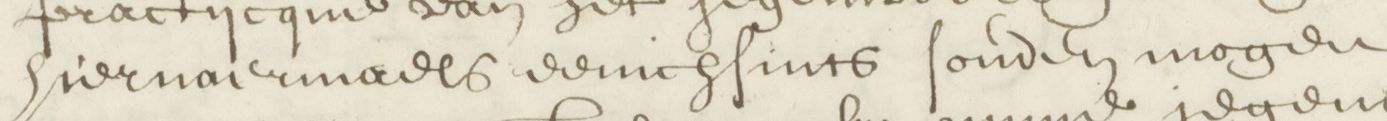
hiernaermaels eenichsints souden mogen
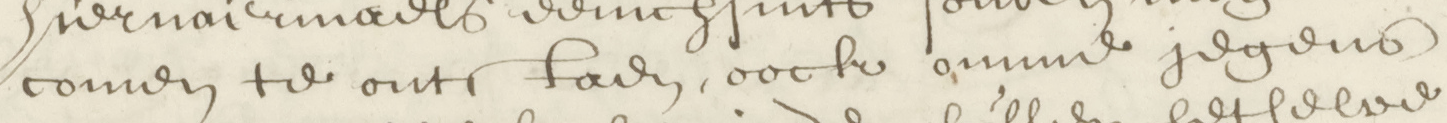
comen te ontstaen, oock omme jegens
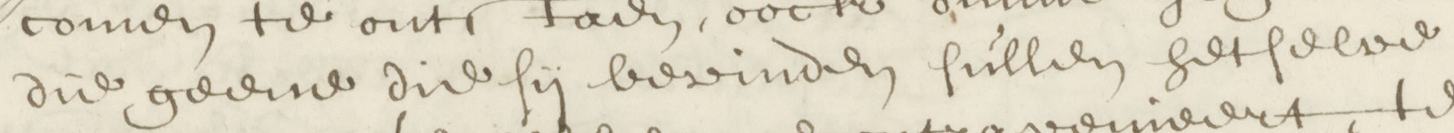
die geene die sij bevinden sullen hetselve
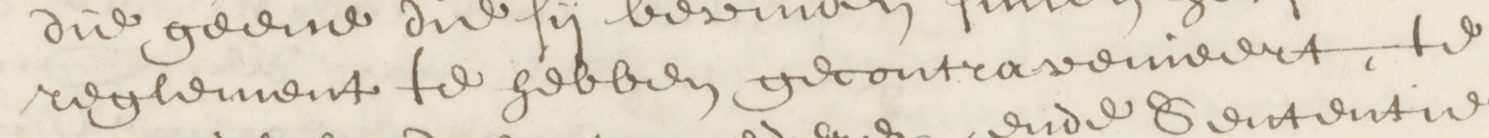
reglement te hebben gecontravenieert, te
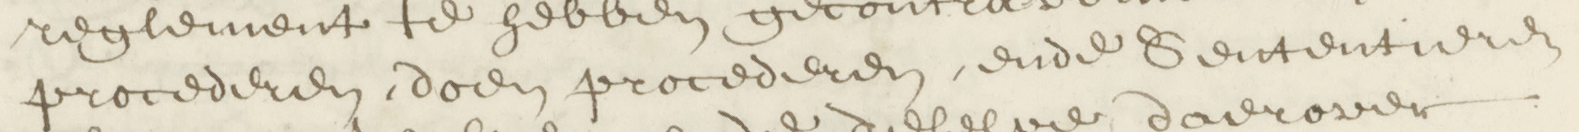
procederen, doen procederen, ende Sententieren
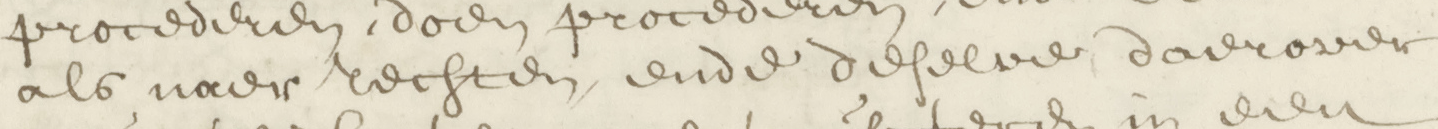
als naer rechten, ende deselve daerover
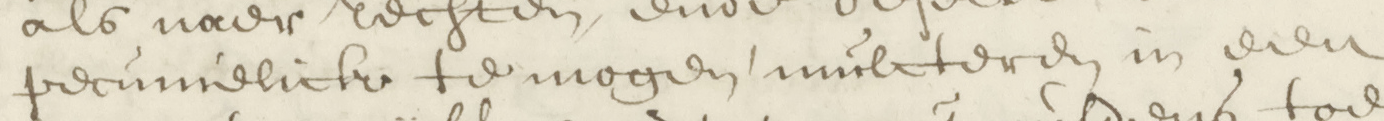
pecunielick te mogen mulcteren in een
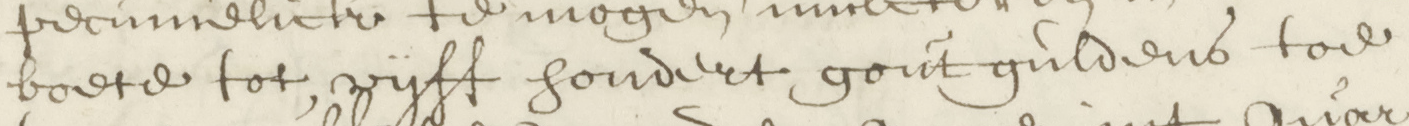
boete tot vijff hondert goutguldens toe,
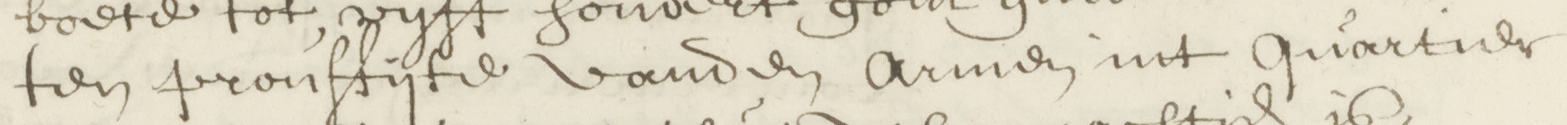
ten prouffijte vanden Armen int Quartier
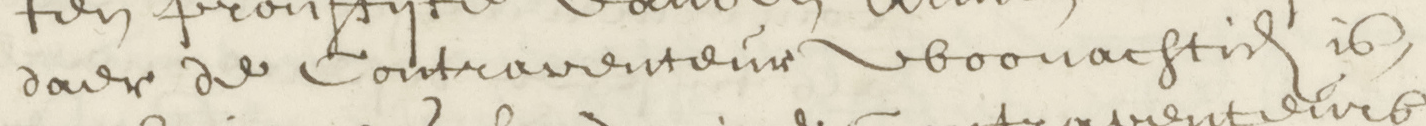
daer de Contraventeur woonachtich is,
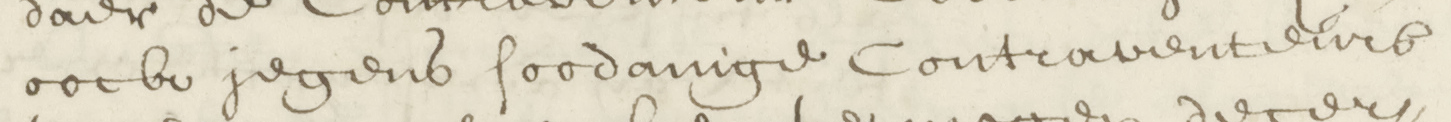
oock jegens soodanige Contraventeurs
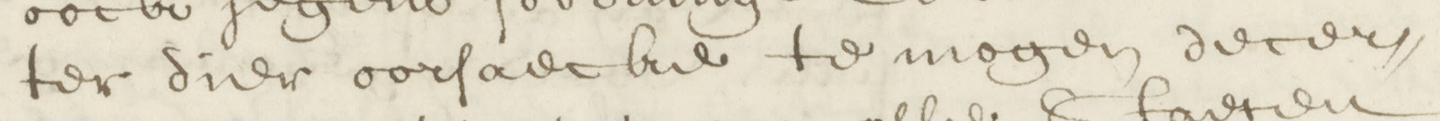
ter dier oorsaecke te mogen decer„
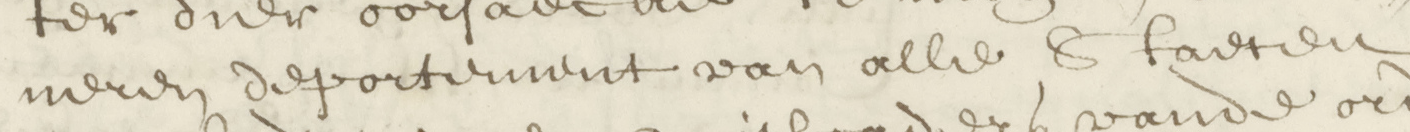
neren deportement van alle Staeten
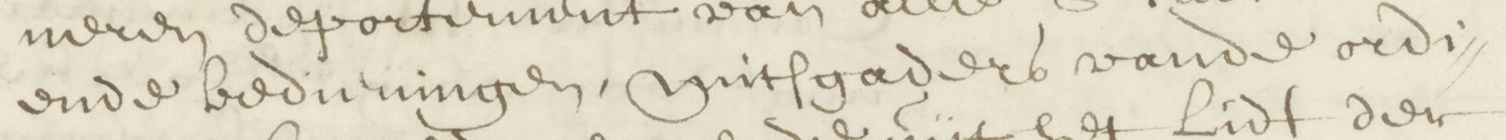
ende bedieningen, mitsgaders vande ordi„
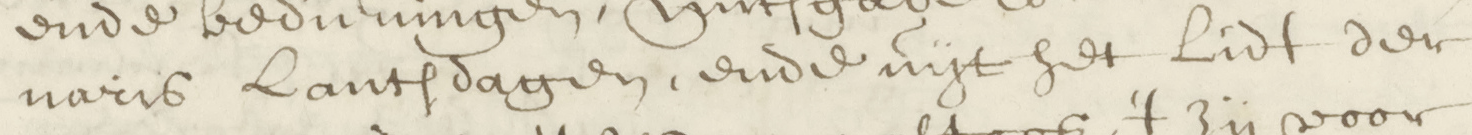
naris Lantsdagen, ende uijt het Lidt der
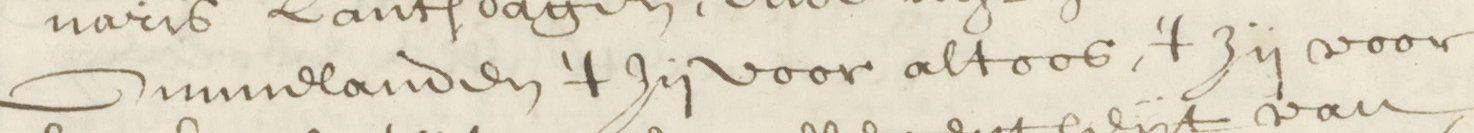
Ommelanden ‛t zij voor altoos, ‛t zij voor
